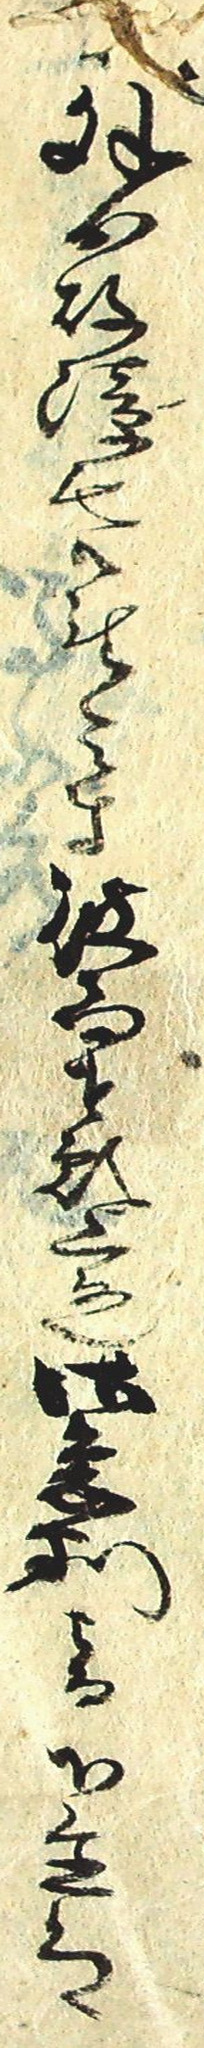外ゟ故障無御座候に付彼者奉願上通御裏判被為下置候はゝ

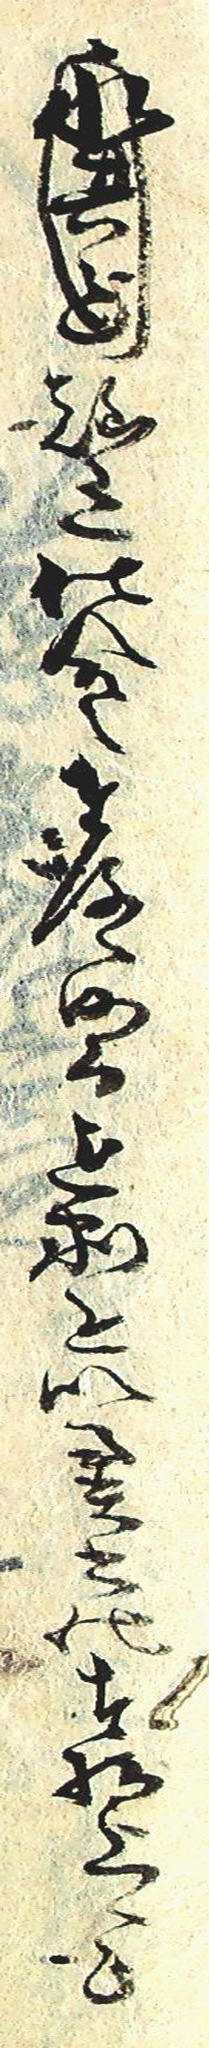「私共迄」難有仕合に奉存候仍て連判を以奥書仕奉指上候以上
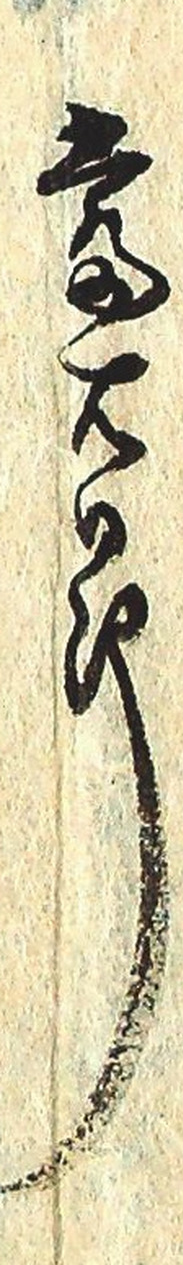当右同断
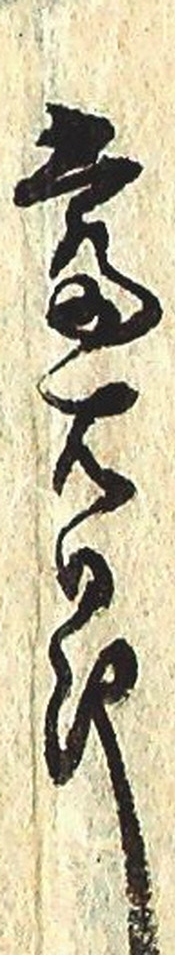当右同断
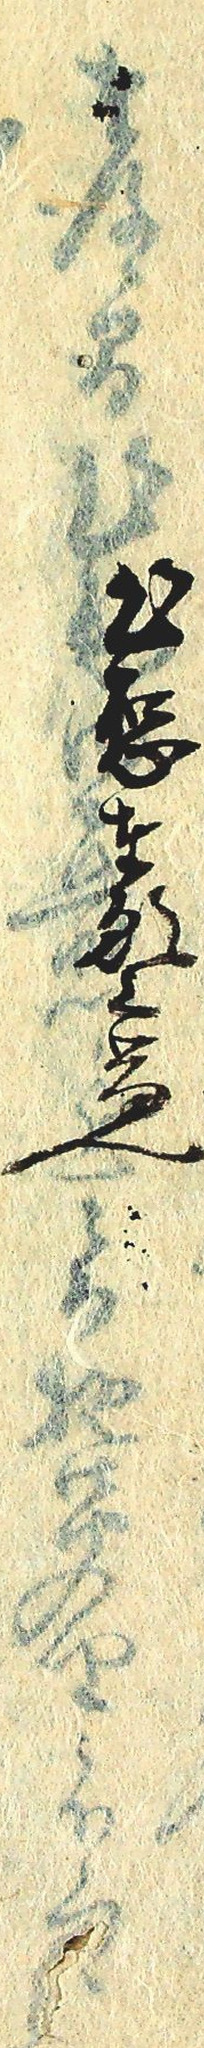乍恐奉願上覚
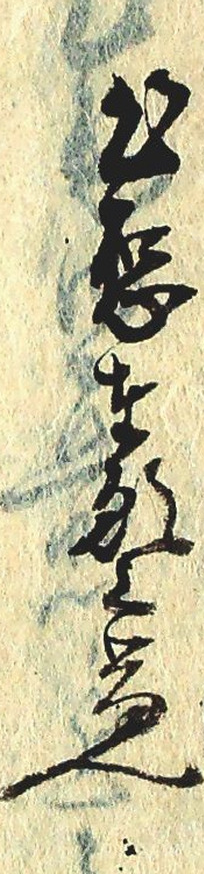乍恐奉願上覚
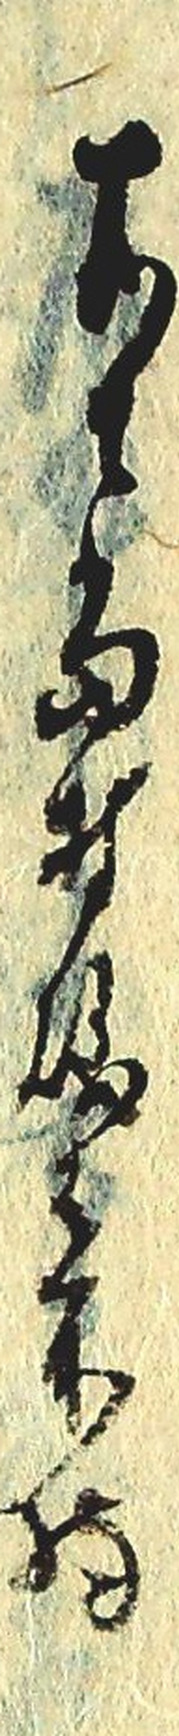右は当村磯太所持
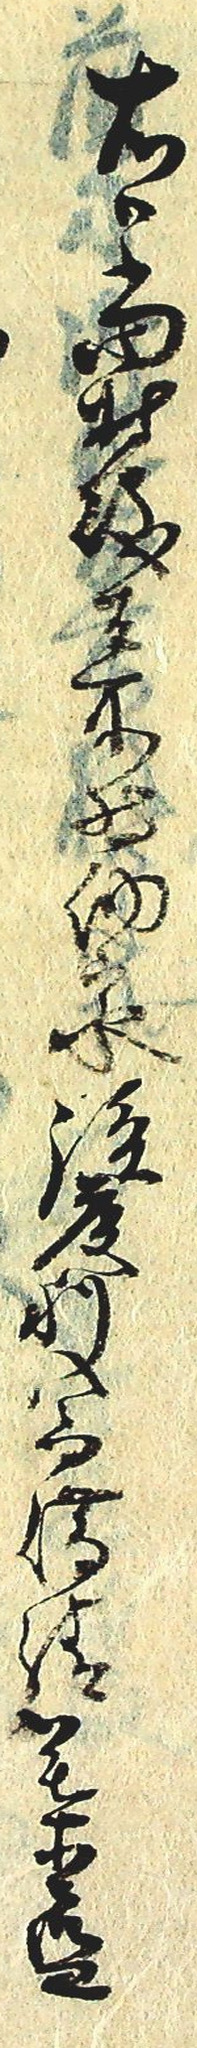右は当村磯太所持納家後藤利八郎借請葉藍
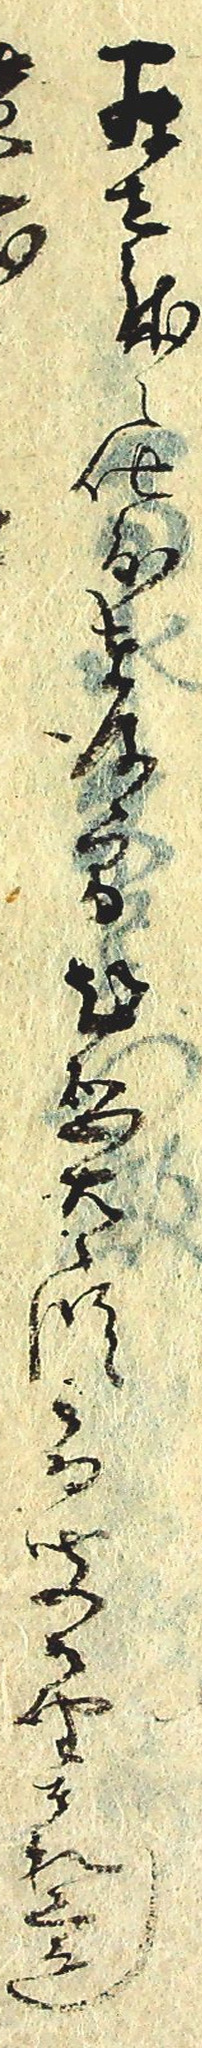寐せ床に仕度奉存候間乍恐右之段被為聞召届奉願上通
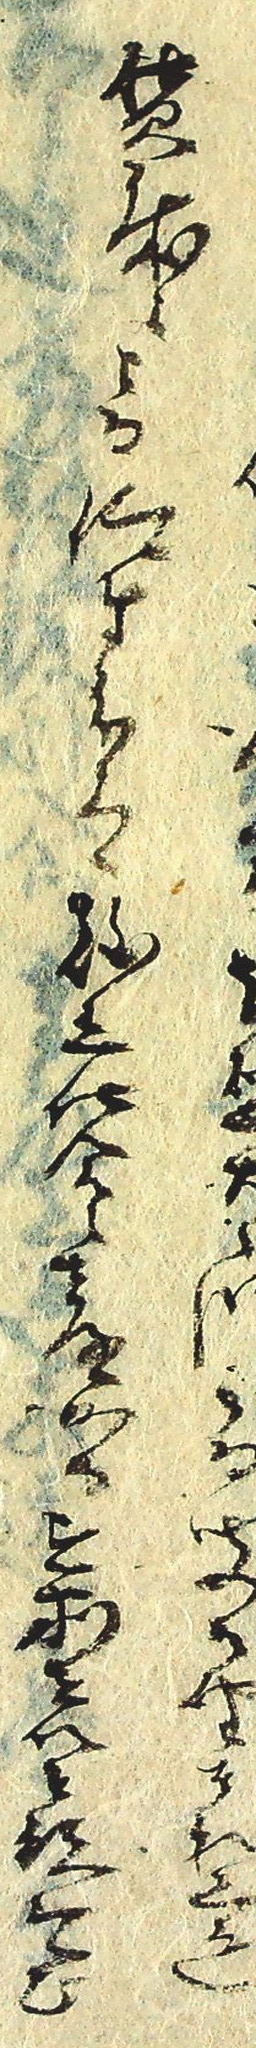貸床に被為仰付被下候はゝ難有仕合に奉存候仍て連判を以奉願上候以上
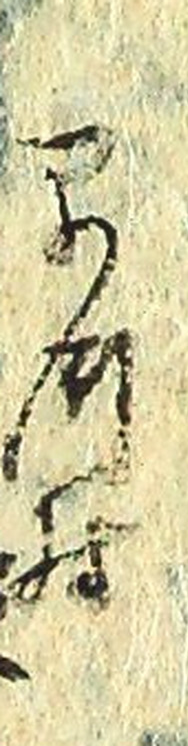早淵村
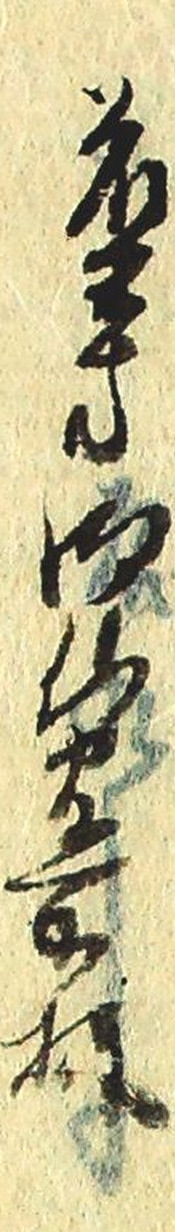藍方御代官所様
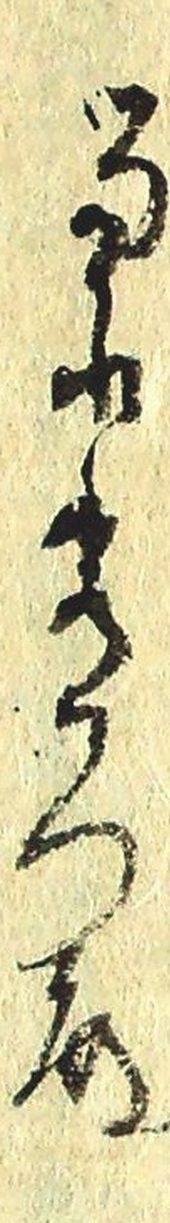富永秀左衛門殿
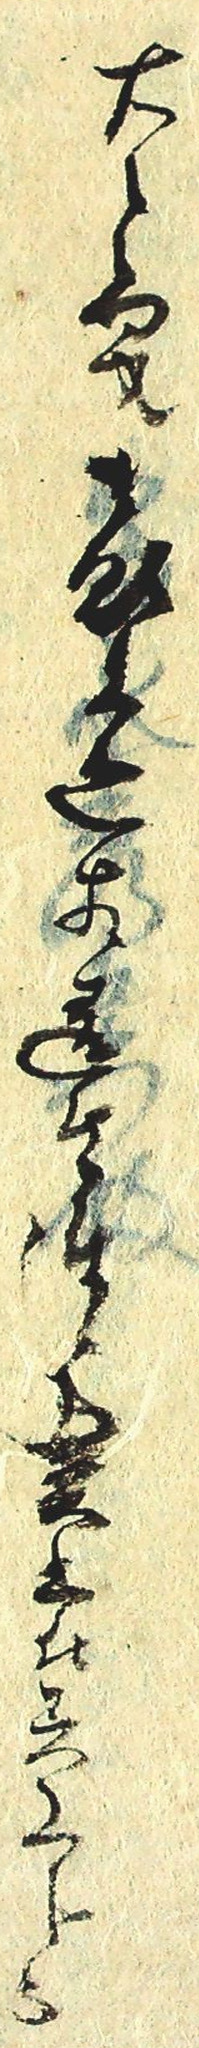右之者共奉願上通相違無御座候奥書仕差上申候以上

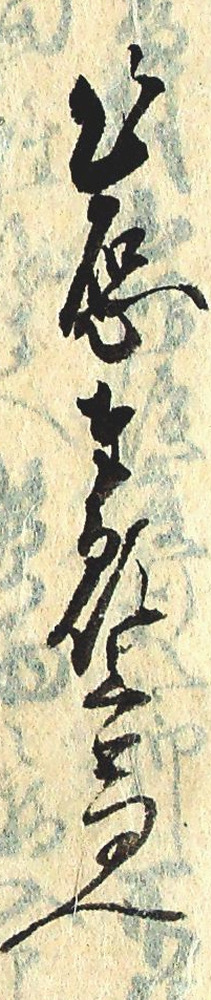乍恐奉願上覚
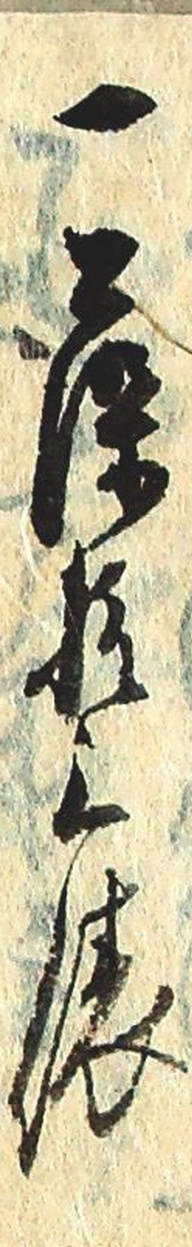一蒅拾三俵
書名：諸御願書控(弐番）
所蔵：鳴門教育大学 Naruto University of Education
